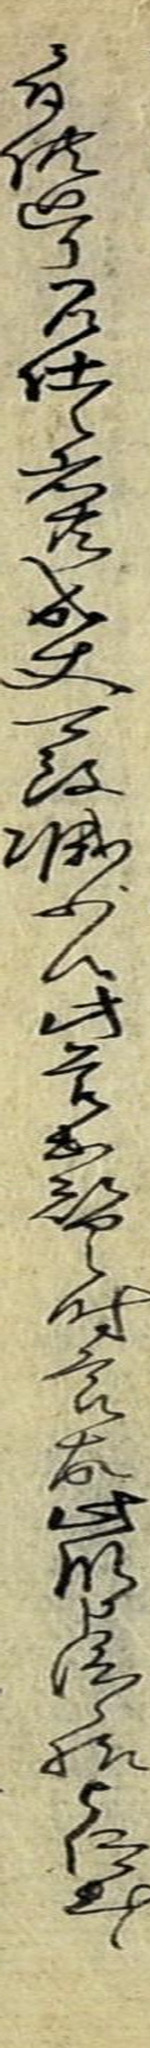ニ付供廻り召仕候者共成丈可致減少候此節出替之時節故此段申渡候様被仰出候
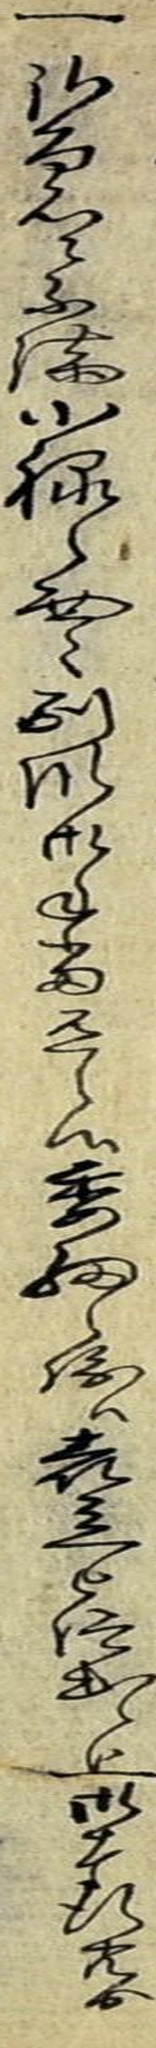一弐百石ニ不満小禄之面々別段御手当有之候委細之儀ハ表立被仰出候上御奉行共ゟ
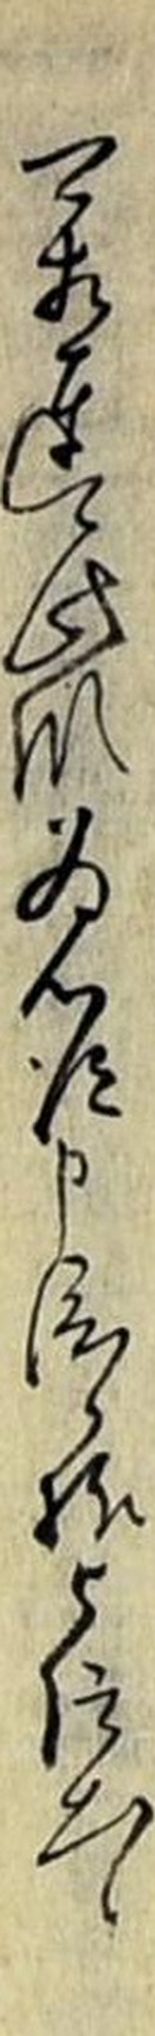可相達候此段為心得申渡候様被仰出候
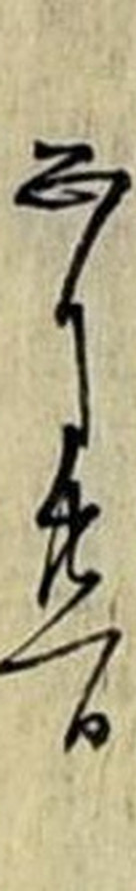正月廿一日
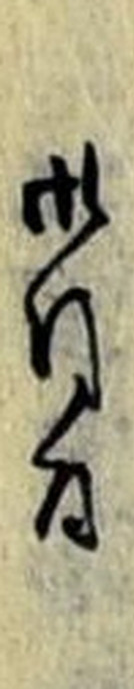御目付
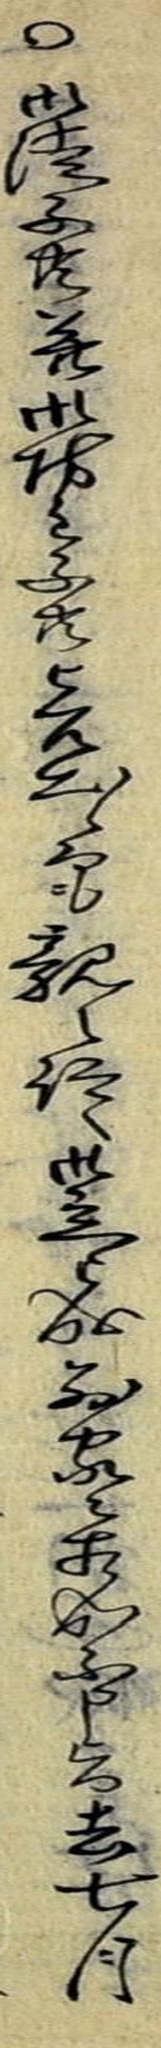〇御徒子共并御坊主子共被召出候而も親之跡へ御立被成別家ニ相成不申旨去七月
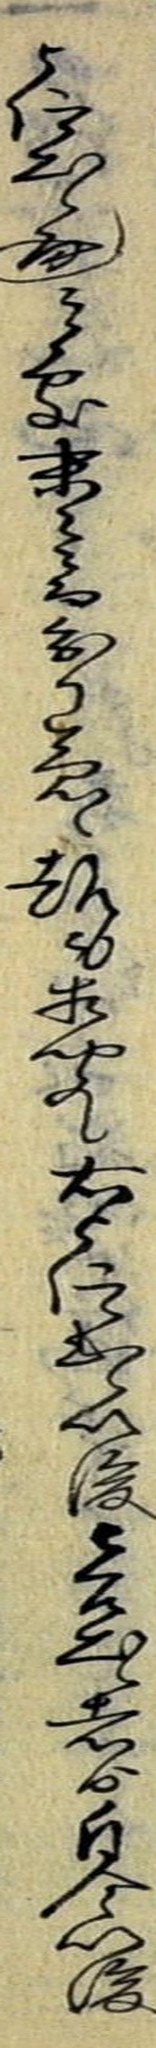被仰出候通ニ候処末々ニ而分り兼候趣も相聞候右被仰出候以後被召出候者ゟ自今以後
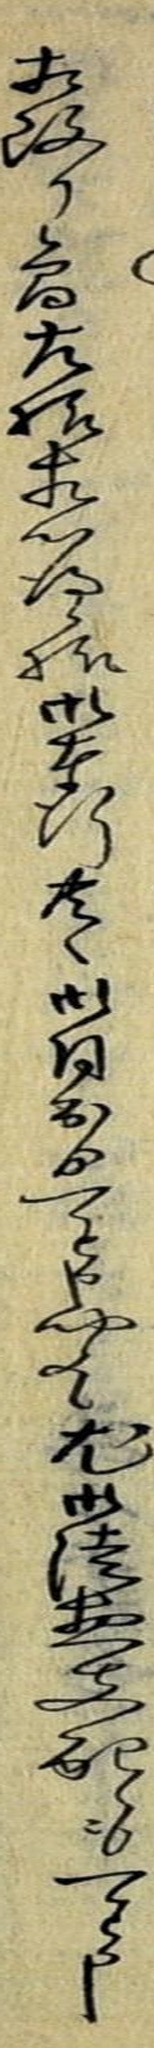相改り候間左様相心得候様御奉行共へ御自分ゟ可申聞候尤御徒惣支配へも可被申
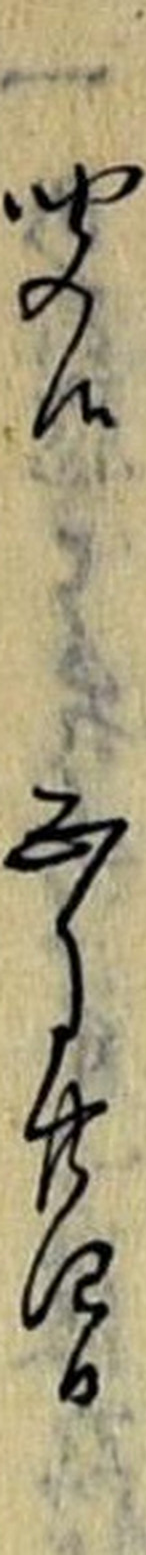聞候正月廿四日
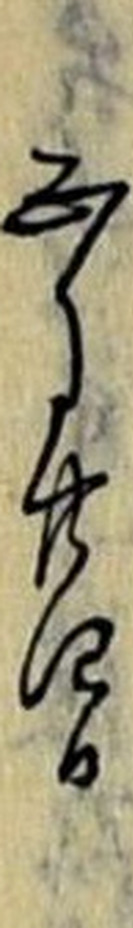正月廿一日
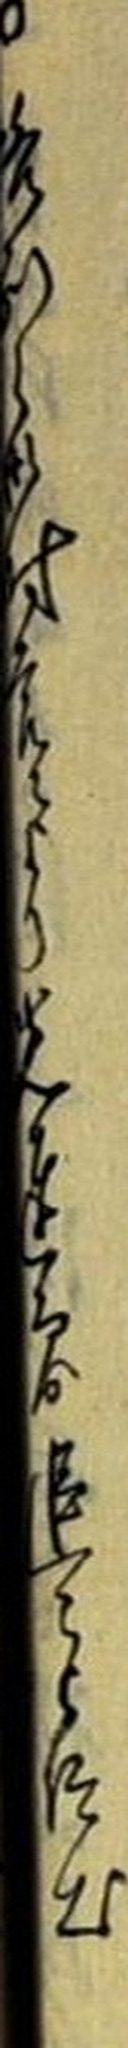〇格別之御時節ニより先達而ゟ追々被仰出
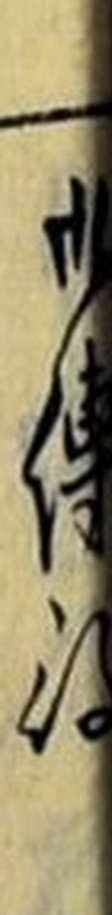御傅役
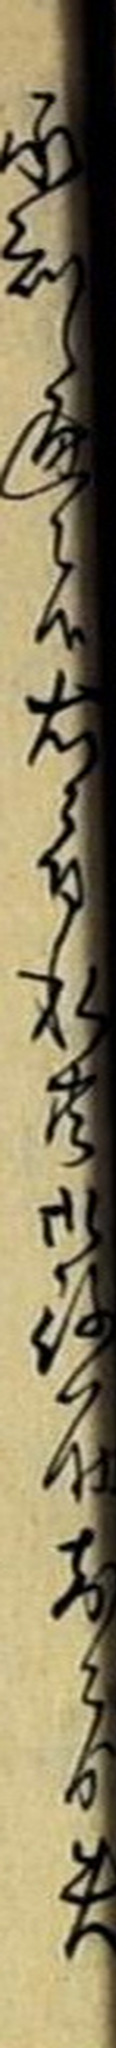承知之通ニ候右ニ付私共御役筋前々ゟ失
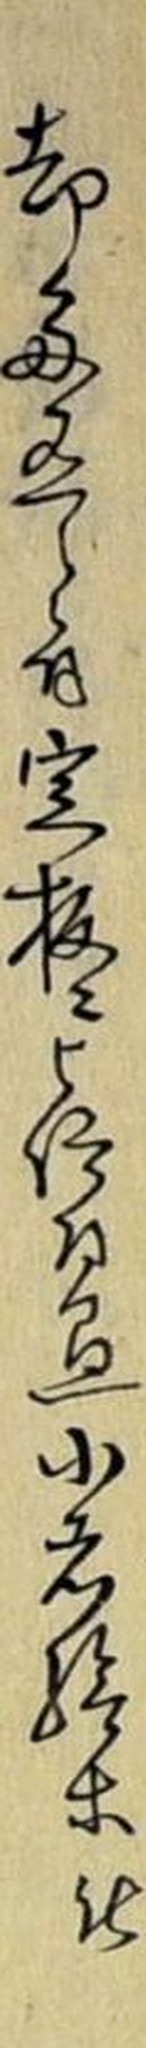却多有之ニ付定板ニ被仰付置小者給等被
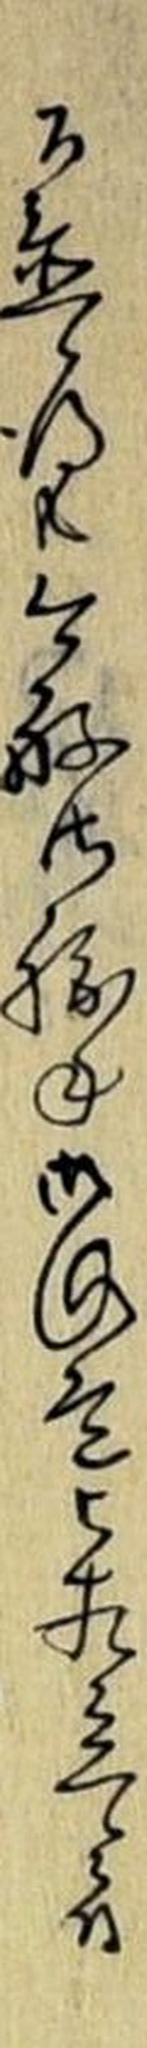下置候得共今般御勝手御趣意被相立候ニ付
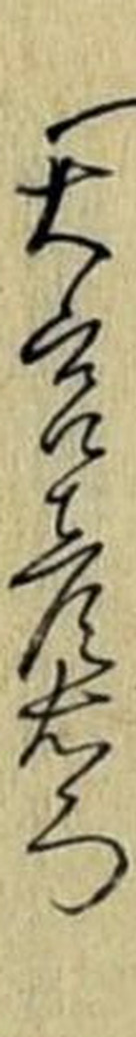大宮彦右衛門
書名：命令之部 三
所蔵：福井県文書館 Fukui Prefectural Archives
